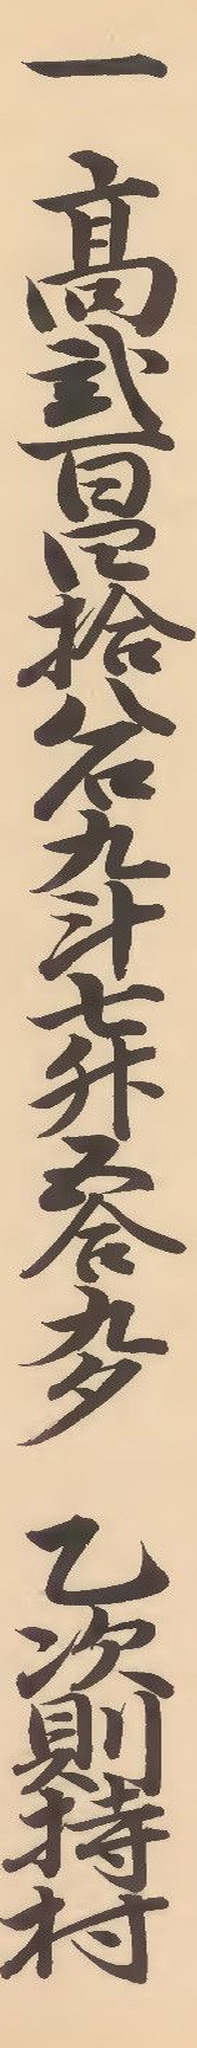一高弐百四拾八石九斗七升五合九勺乙次則持村
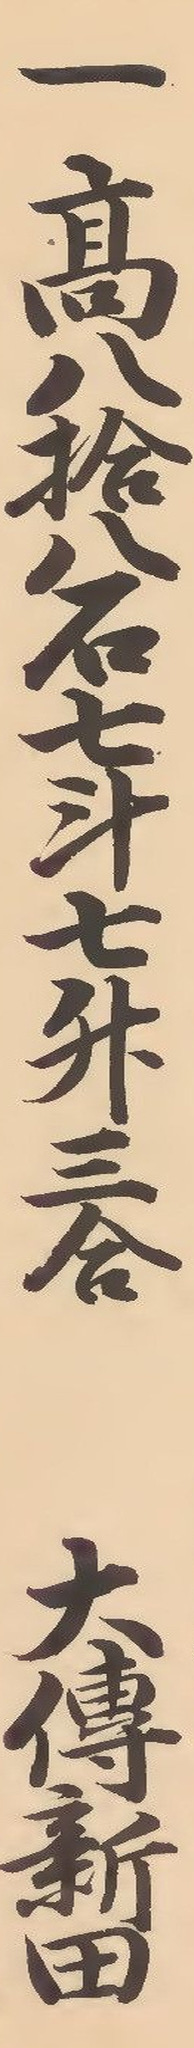一高八拾八石七斗七升三合大伝新田

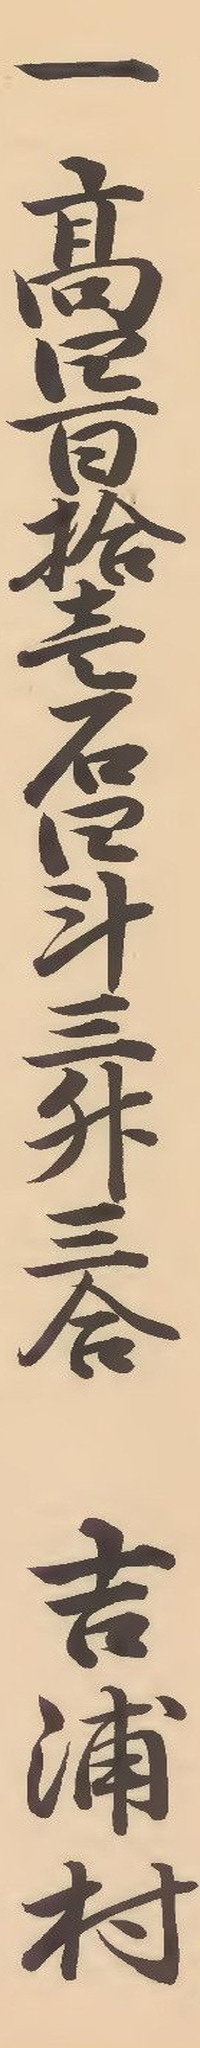一高四百拾壱石四斗三升三合吉浦村
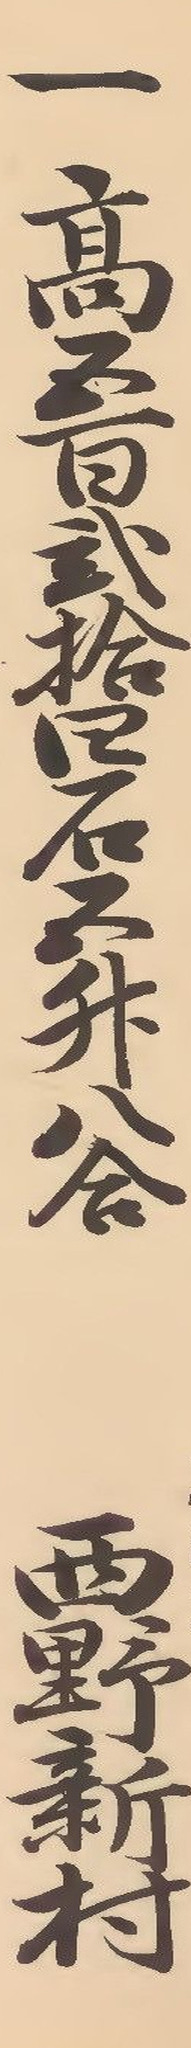一高五百弐拾四石五升八合西野新村
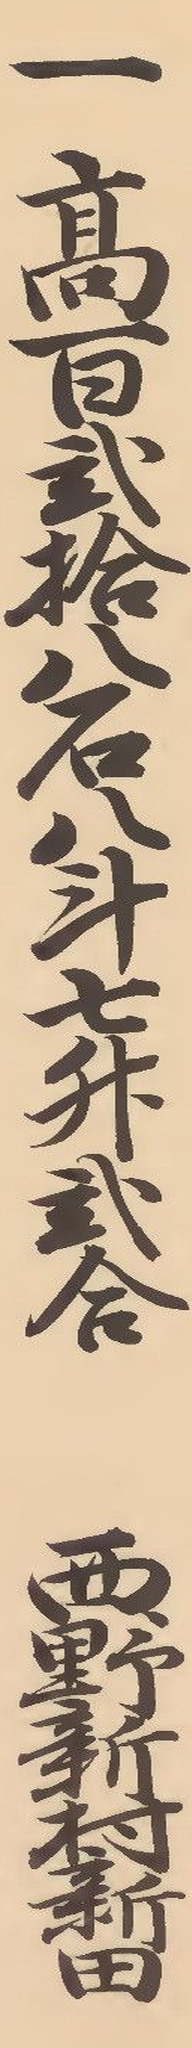一高百弐拾八石八斗七升弐合西野新村新田
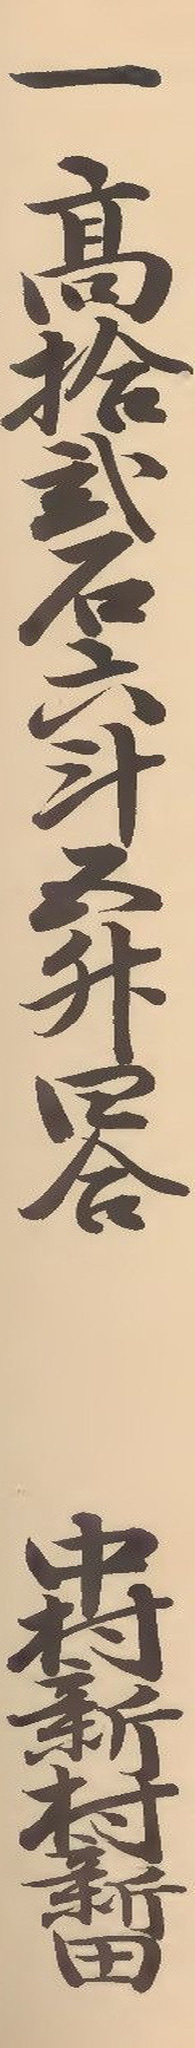一高拾弐石六斗五升四合中村新村新田
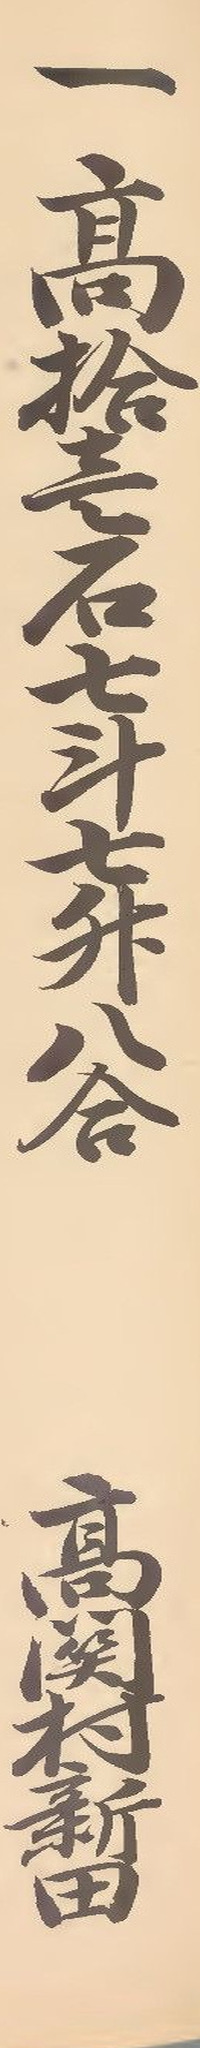一高拾壱石七斗七升八合高関村新田
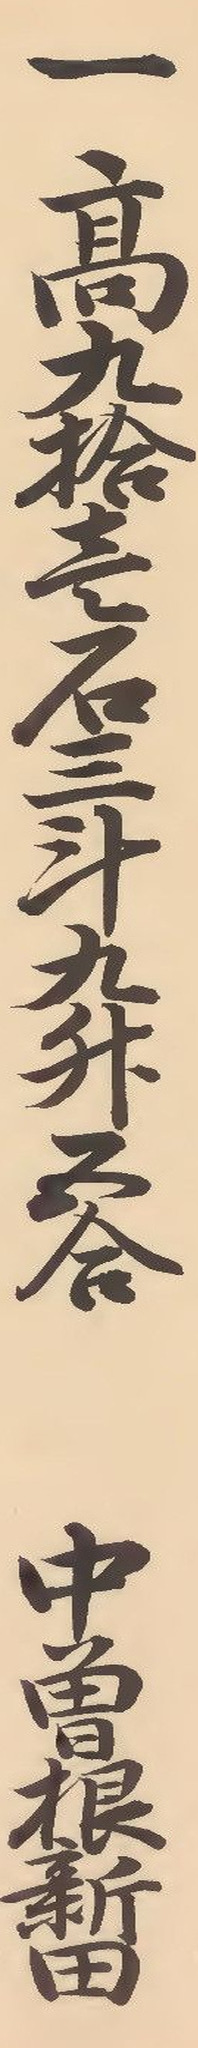一高九拾壱石三斗九升五合中曽根新田
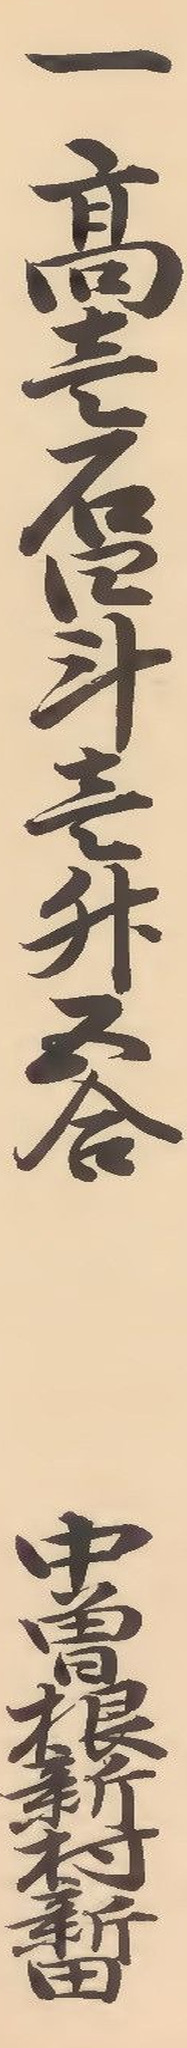一高壱石四斗壱升五合中曽根新村新田
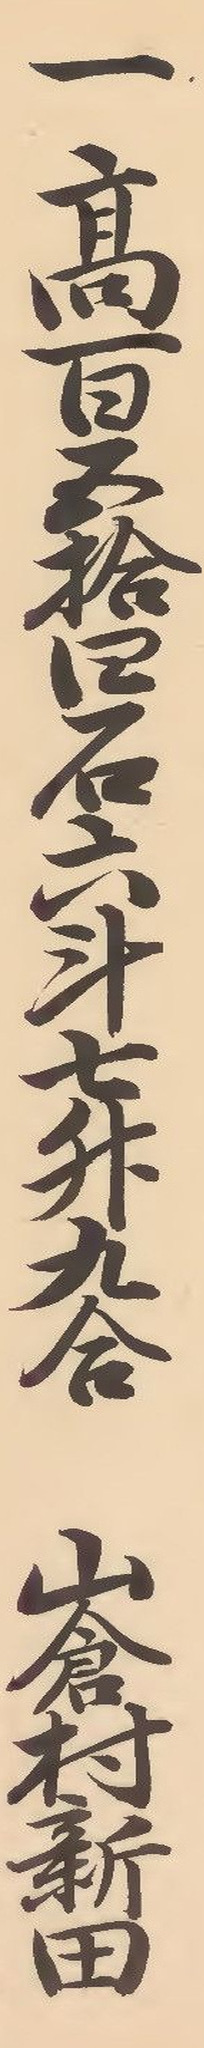一高百五拾四石六斗七升九合山倉村新田

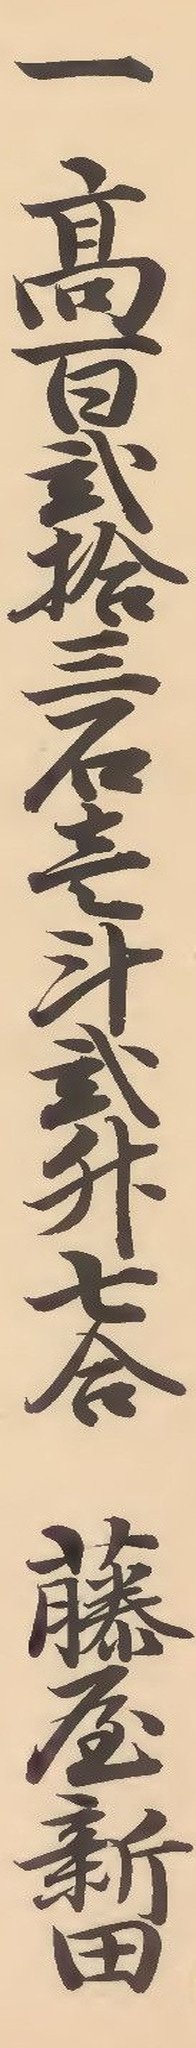一高百弐拾三石壱斗弐升七合藤屋新田
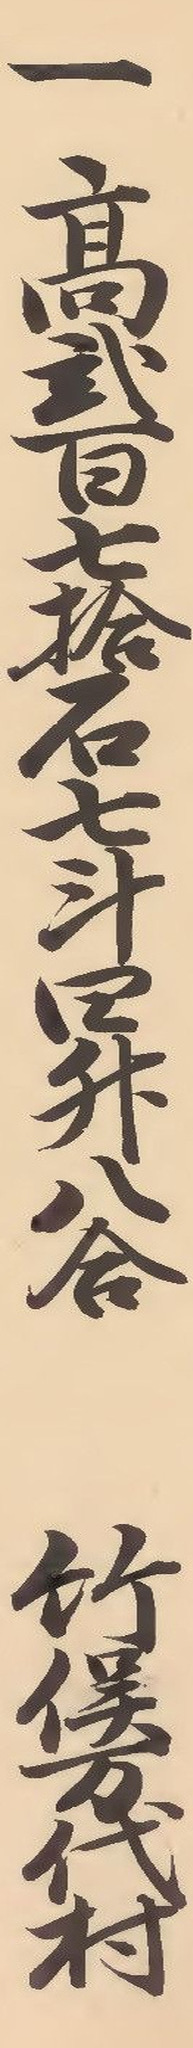一高弐百七拾石七斗四升八合竹俣万代村
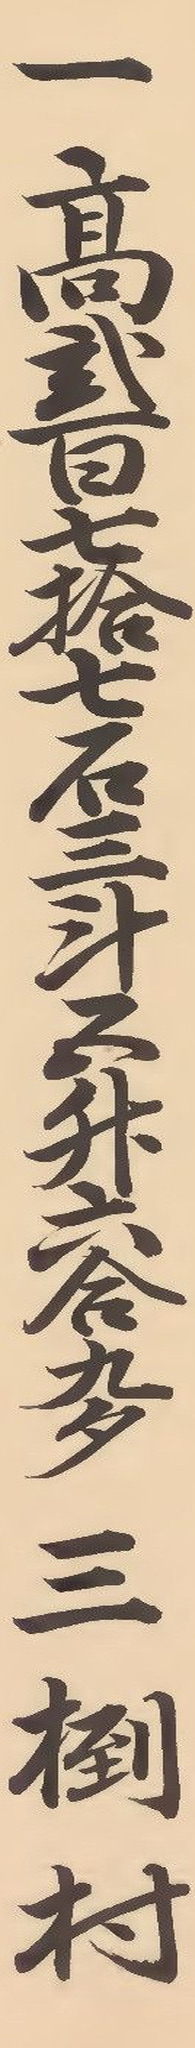一高弐百七拾七石三斗五升六合九勺三椡村
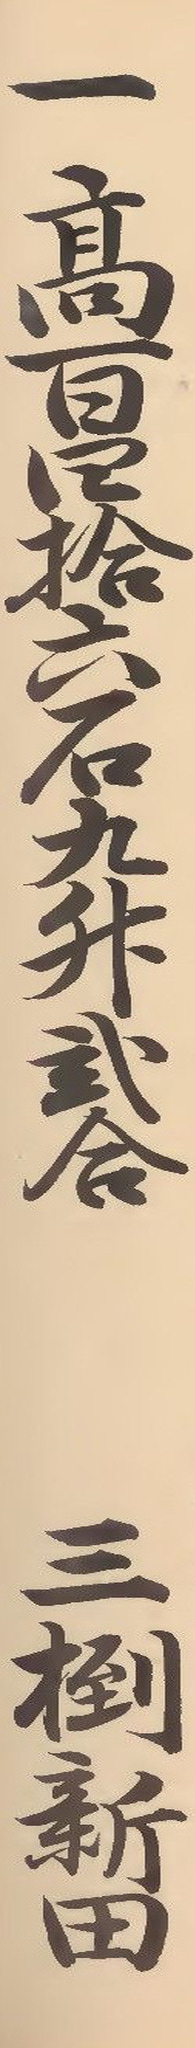一高百四拾六石九升弐合三椡新田
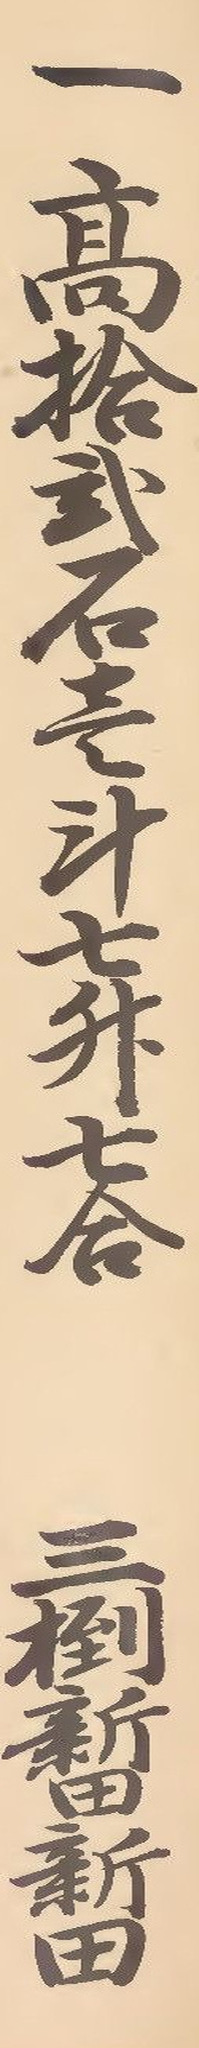一高拾弐石壱斗七升七合三椡新田新田
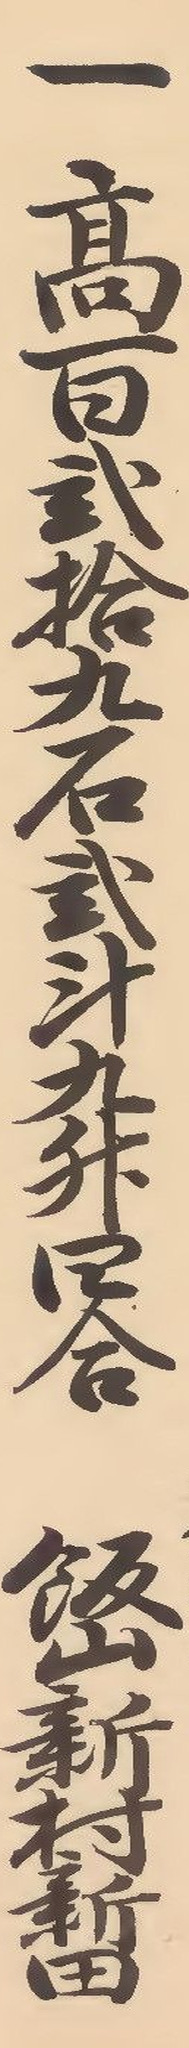一高百弐拾九石弐斗九升四合飯山新村新田
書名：越後国郷帳　下
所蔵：国立公文書館 National Archives of Japan
